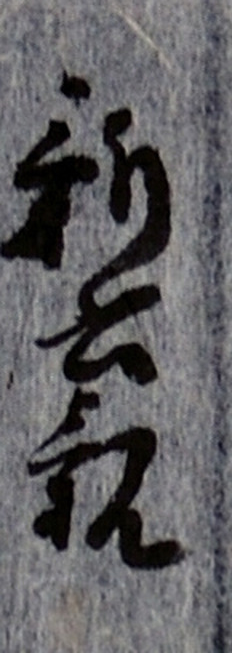新六倅
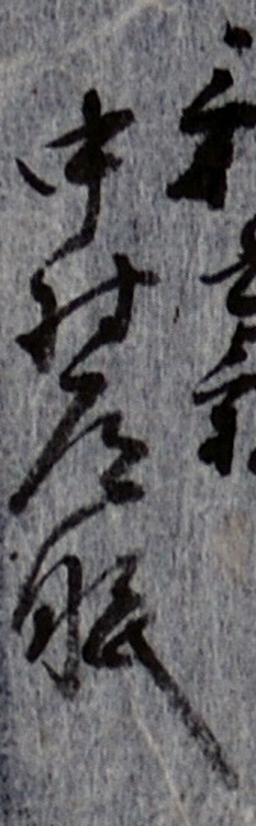中村道眼
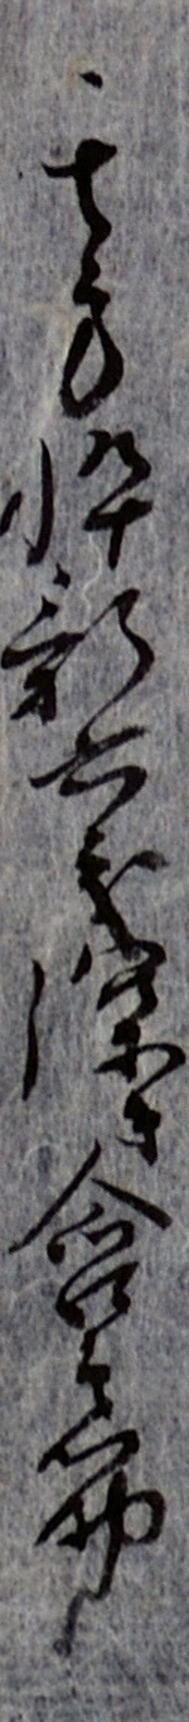其方倅新六義深き含之筋
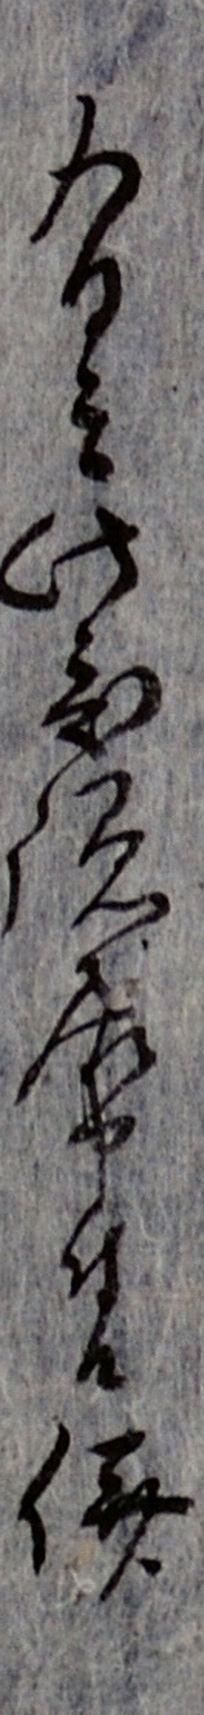有之此度隠居申付候併
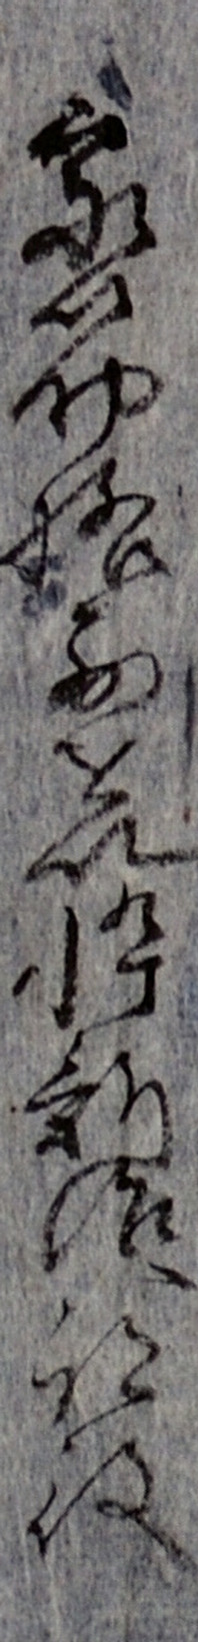家筋格別を以新作改役
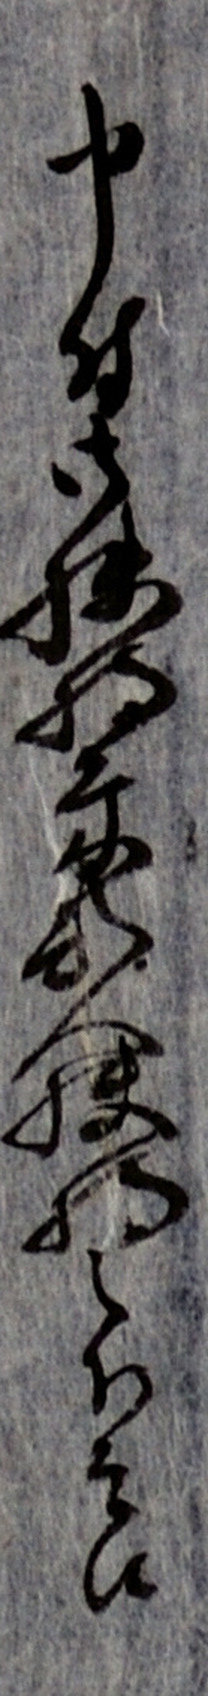申付御扶持米弐人扶持被下候
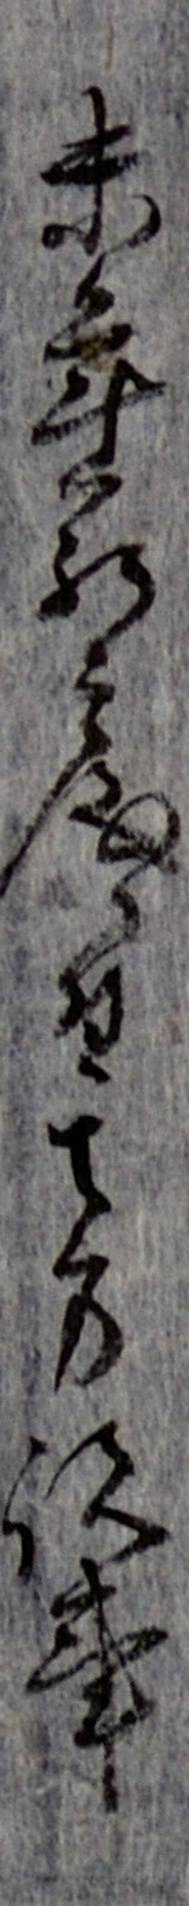未年之儀ニ付其方訳事
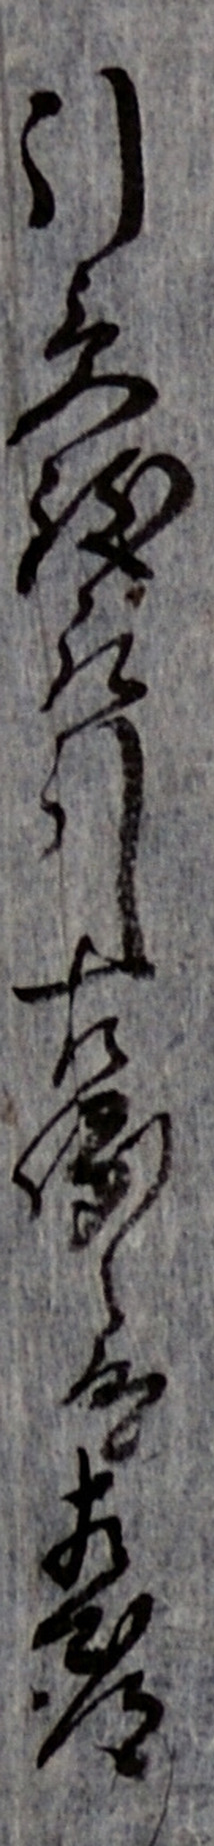引受致候ハハ古例之通相心得
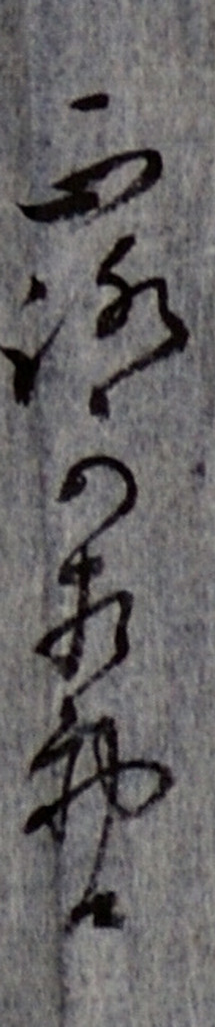正路可相勤候
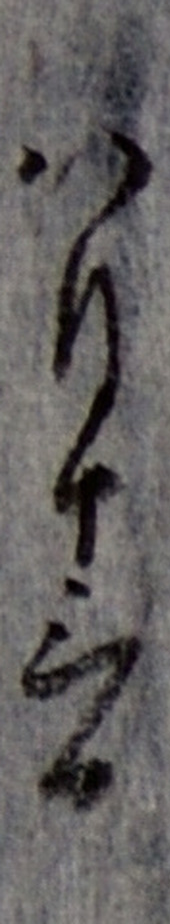八月十三日
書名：覚
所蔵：伊那市立高遠町図書館・合同会社AMANE
